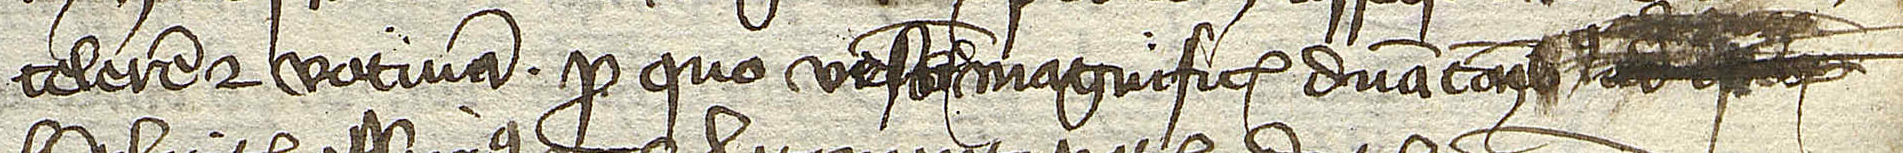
clere* @ votiua* . p* quo veſtr* magnific* d*nac*on*b*
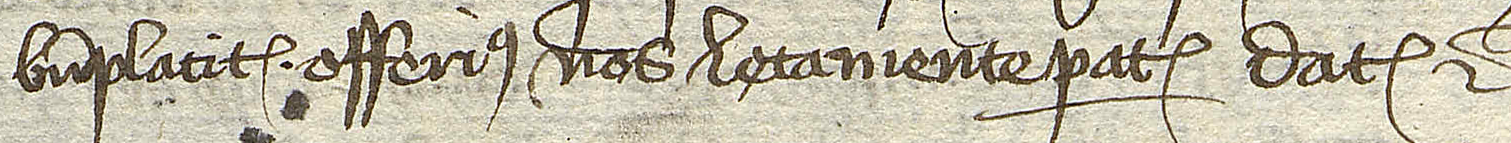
b*n*placit* offeri* nos letamente pa*t* Dat* ec*
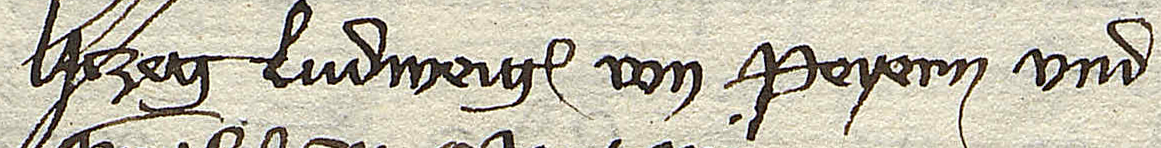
H*rʒog Ludweig* von Peyern vnd
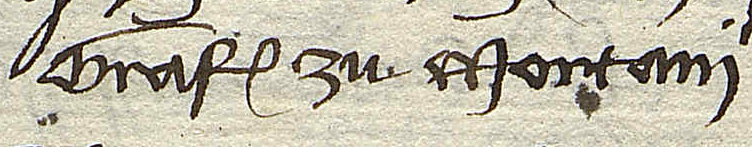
Graf* ʒu Mortani
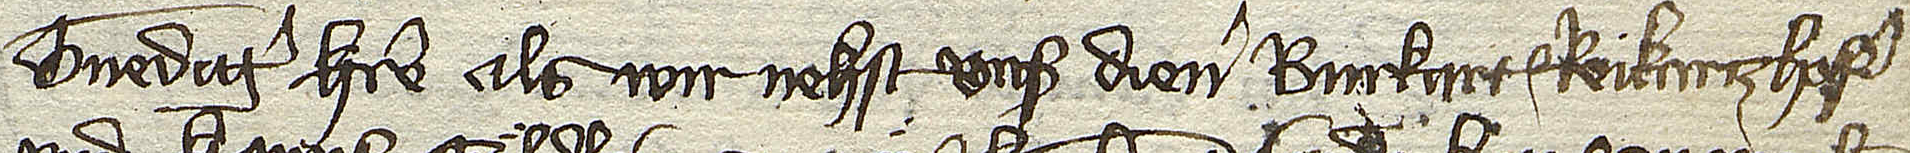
Gnedig* H*re als wir nehſt vnſ* dien* Burkart* Reikarcʒhof*
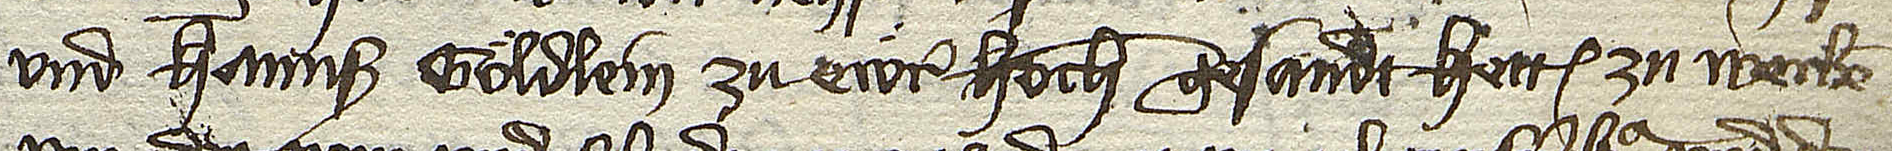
vnd Hannſ* Göldlein ʒu eẅr hoch* geſandt hett* ʒu werbe*
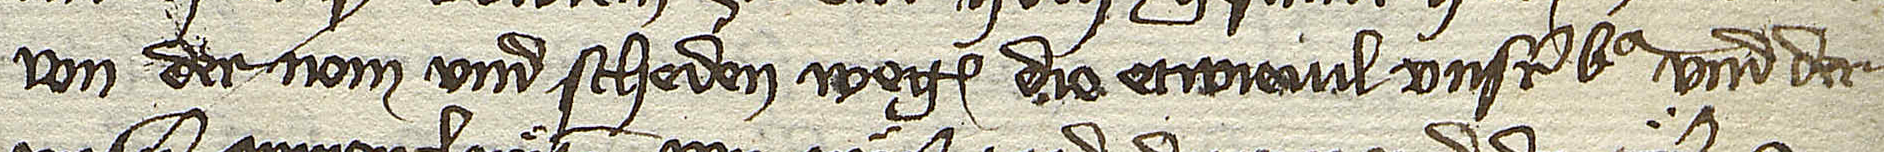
von der nom vnd ſcheden weg* die etwieuil vnſ*r b* vnd der
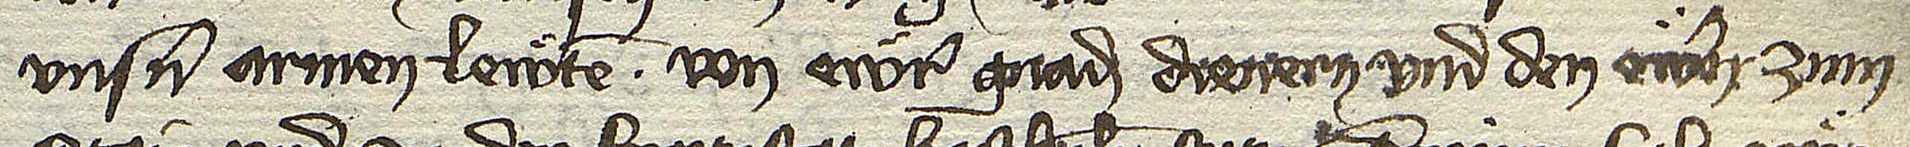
vnſ*n armen leẅte* . von eẅr* gnad* dienern vnd den eẅ*n ʒum
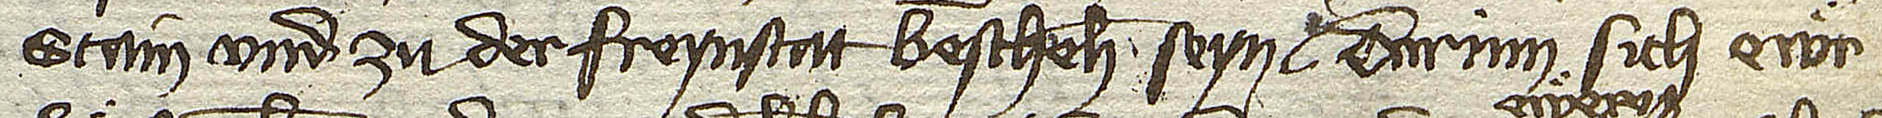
Stain vnd ʒu der freynſtat beſcheh* . ſeyn / Darinn ſich eẅr
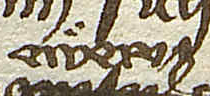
eẅern
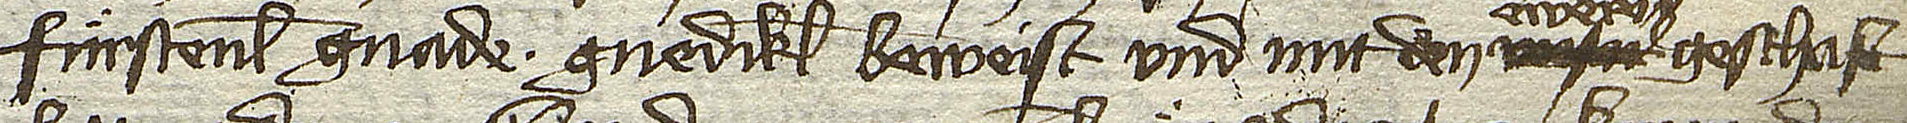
fürſtenl* gnade . gnedikl* beweiſt vnd mit den vnſn* geſchaft
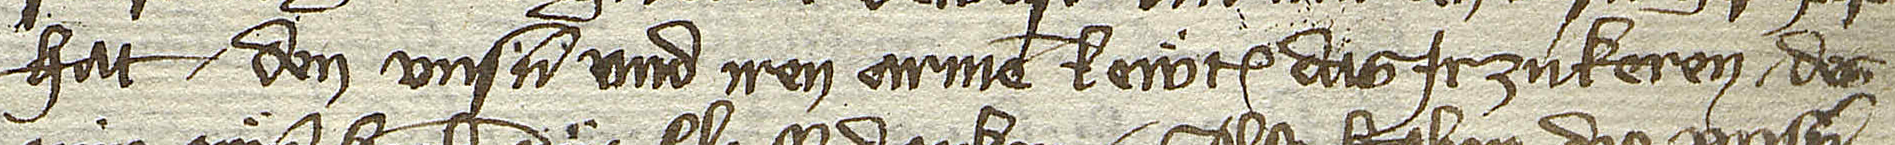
hat / den vnſ*n vnd iren arme* leẅt* das Ir ʒukeren / des
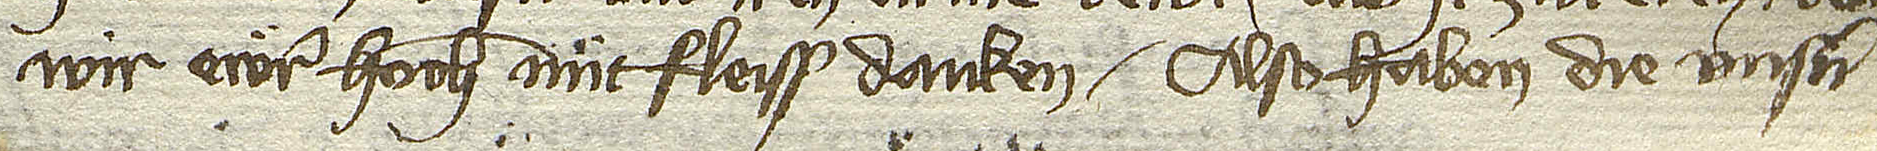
wir eẅr* hoch* mit fleiſſ danken / Alſo haben die vnſ*n
